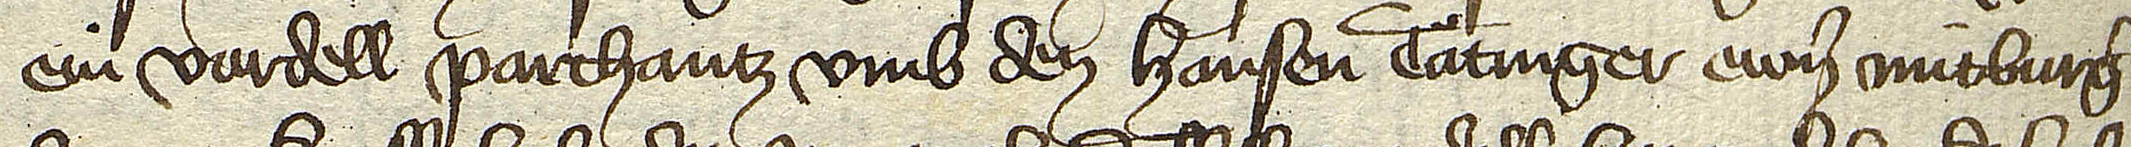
ein vardell parchancʒ vmb den Hanſen Tätinger ewn* mitburg*
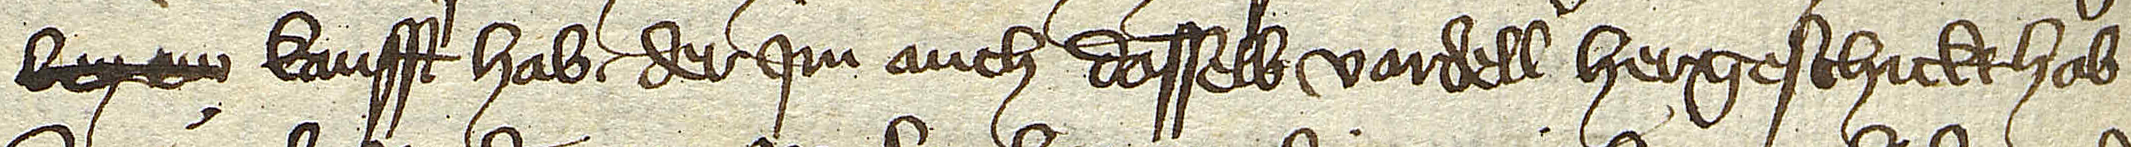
bey ew kaufft hab / der Im auch daſſelb* vardell hergeſchickt hab
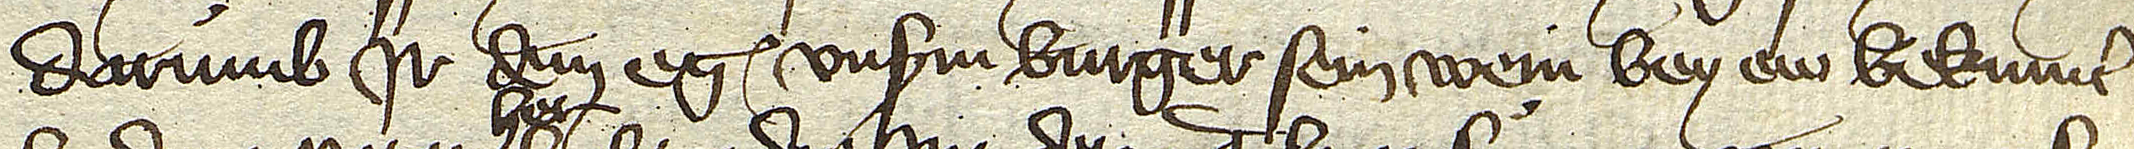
darümb Ir dem eg* vnſ*m burger ſein wein bey ew bekumt*
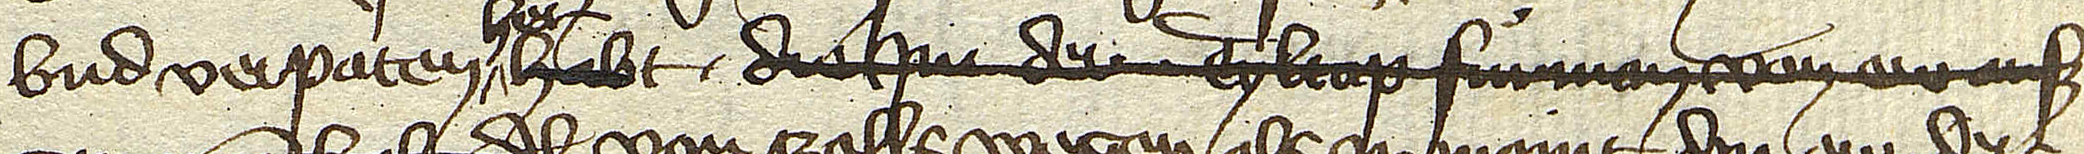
vnd verpoten habt / die Im den Tybtap fürman von ew auſʒ
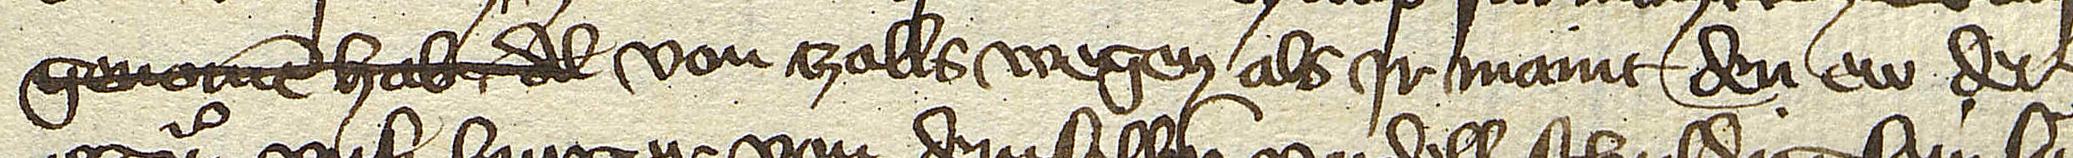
genome* hab / Al von cʒolls wegen als Ir maint den ew der
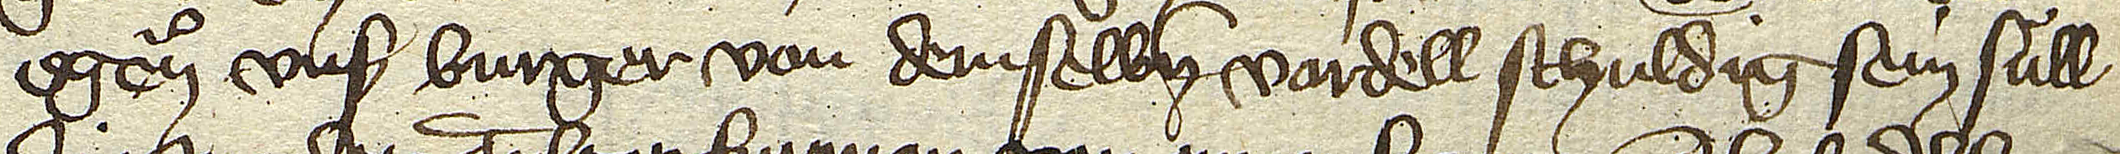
egen* vnſ* burger von demſelbn* vardell ſchuldig ſein ſüll
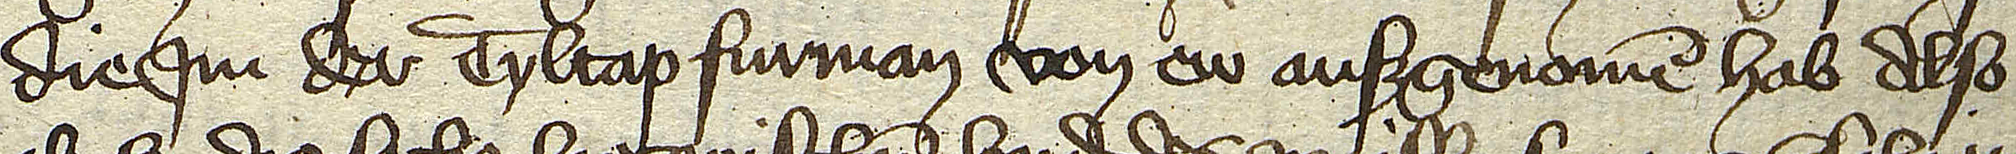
die Im der Tyltap furman von ew auſʒgenome* hab Alſo
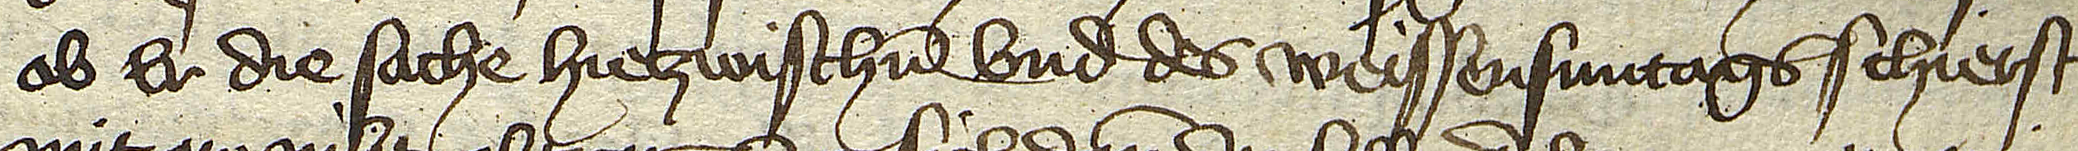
ob Er die ſache hiecʒwiſchn* vnd des weiſſenſuntags ſchierſt
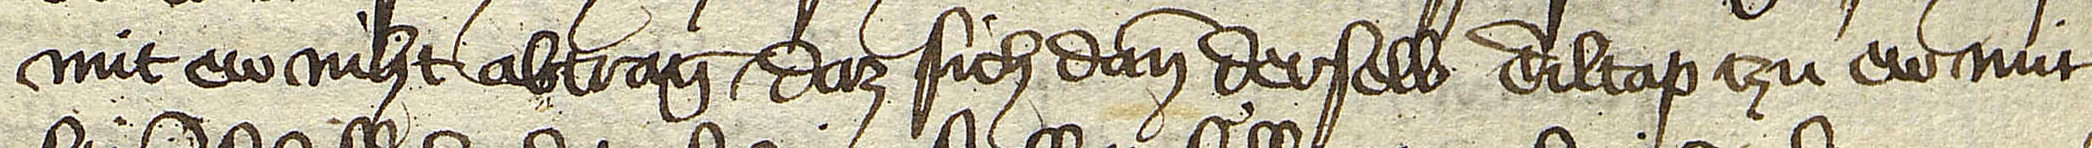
mit ew niht abtrag / daʒ ſich dan* derſelb Tiltap cʒu ew mit
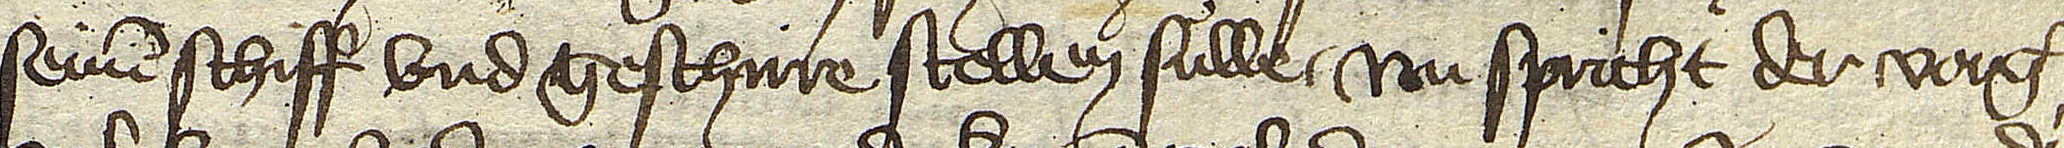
ſeine* ſchiff vnd geſchirre ſtellen ſülle / Nu ſpricht der vorg*
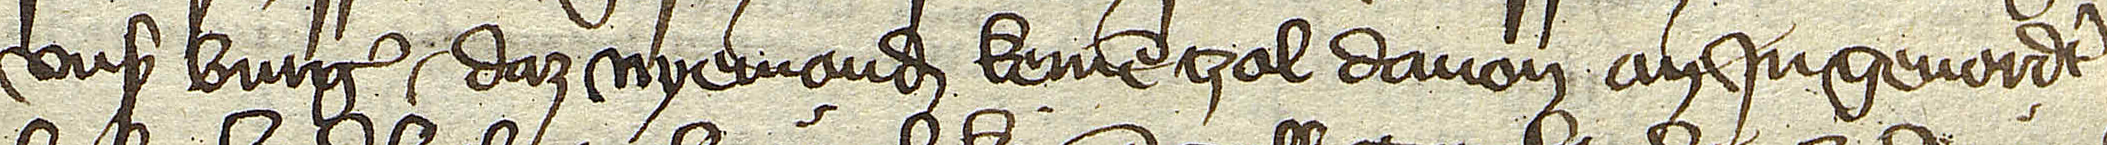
vnſ* burg* / daʒ nyemand* keine* cʒol dauon an In geuordt*
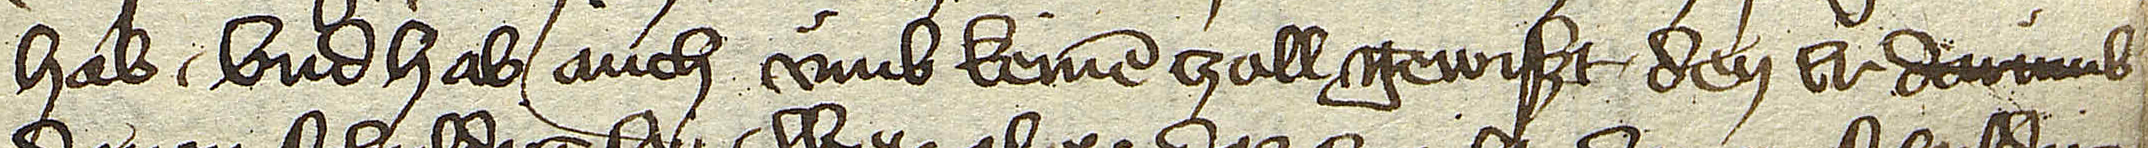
hab / vnd hab auch v̈mb keine* cʒoll gewiſʒt den Er darümb
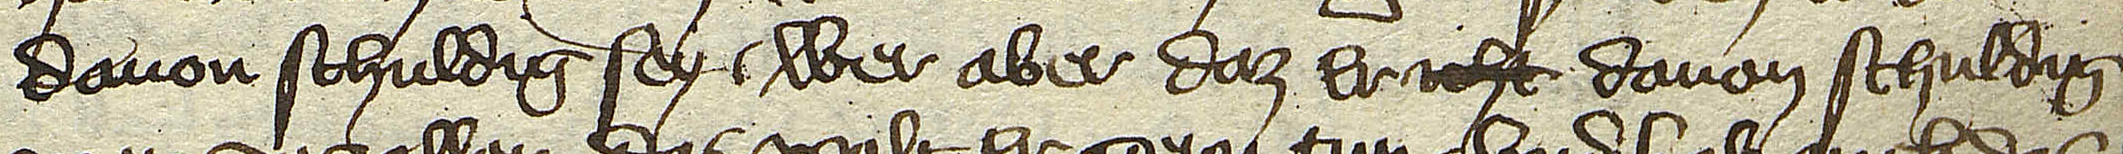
dauon ſchuldig ſey / wer aber daʒ Er icht dauon ſchuldig
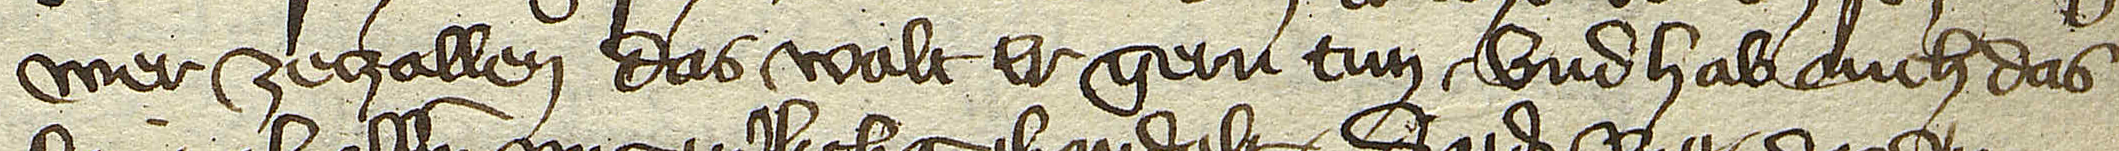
wer cʒecʒollen das wolt Er gern tun / vnd hab auch das
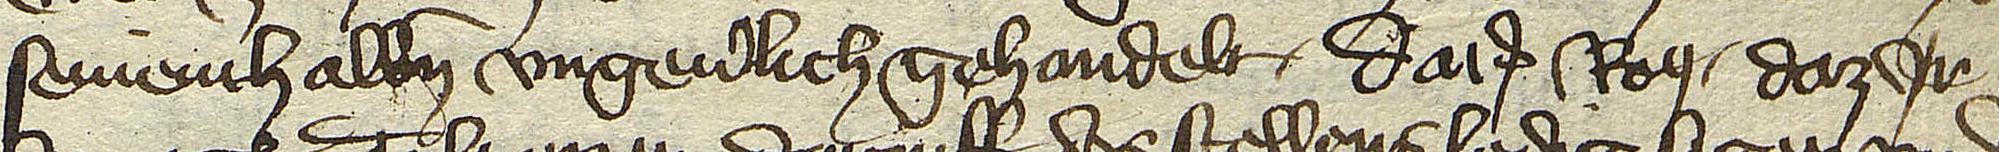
ſeinenthalbn* vngeu*lich gehandelt / Dar § Ro* / daʒ Ir
